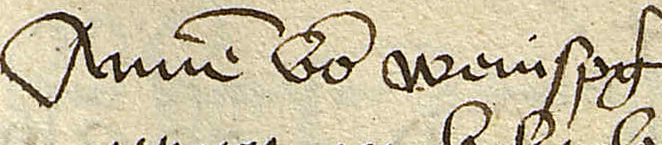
Anne* vo* weinpg*
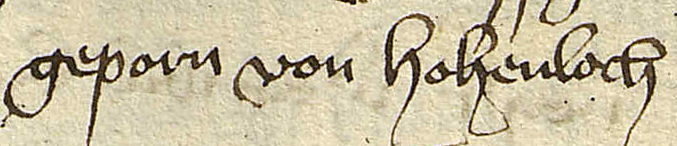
geporn von Hohenloch
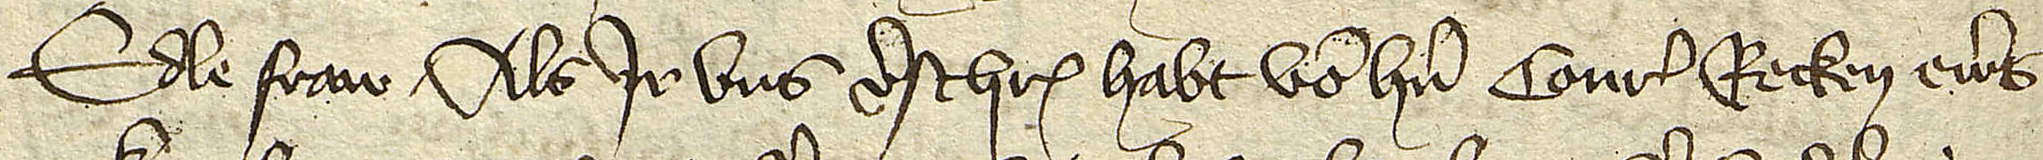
Edle fraw / Als Ir vns v*chr* habt vo* hn* Conr* Recken ew*s
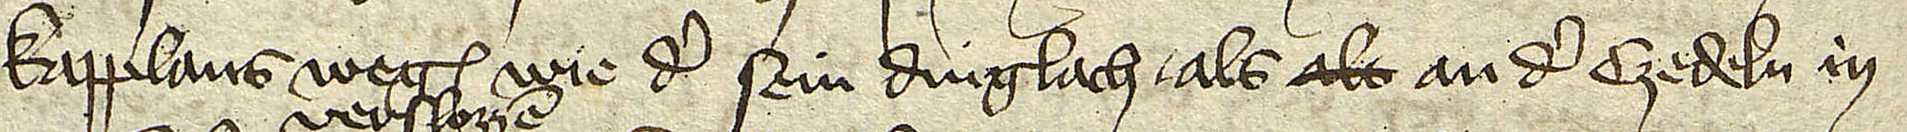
Kapplans weg* wie d* ein dinglach / als al an d* Cʒedeln in
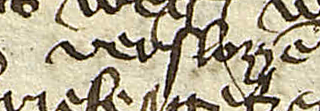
verſloʒʒe*
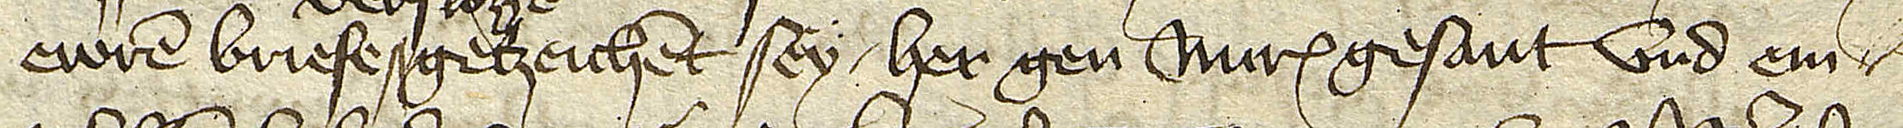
ewre* briefe gecʒeichet* ſey / her gen Nur* geſant vnd em /
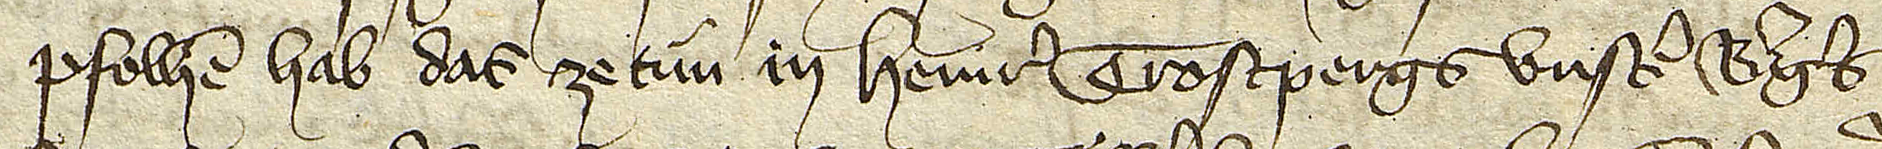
pfolhe* hab das cʒe tun in Heinr* Troſtpergs vnſs* B*g*s
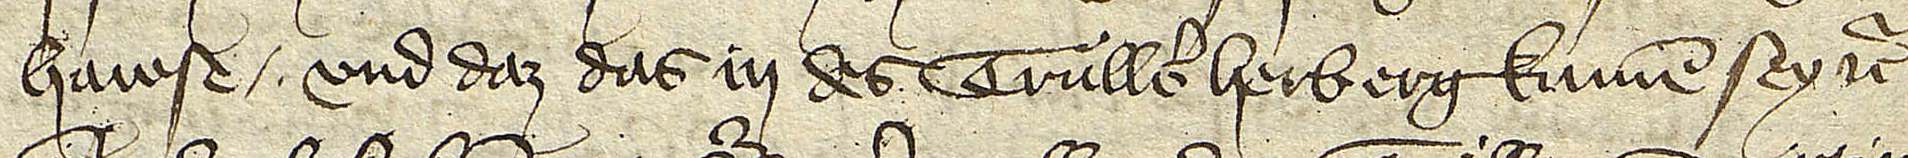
hawſe / . vnd daʒ das in des Trülls* herberg kume* ſey ec*
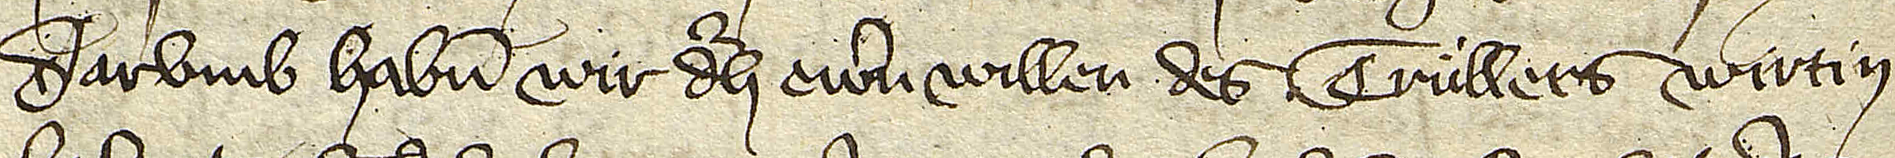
Darvmb habn* wir d*h ew*n willen des Trüllers wirtin
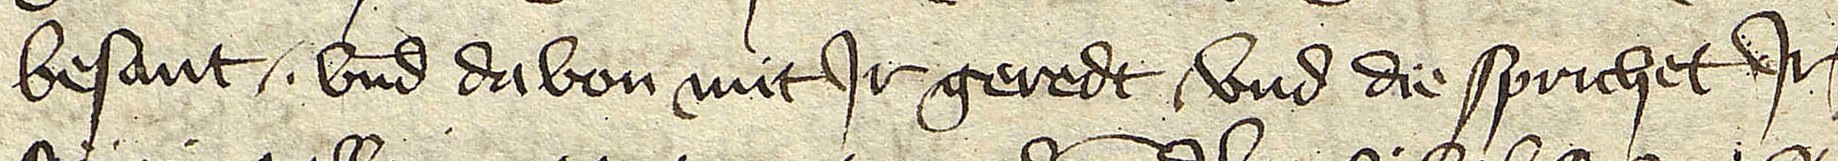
beſant / . vnd davon mit Ir geredt / vnd die ſprichet Ir
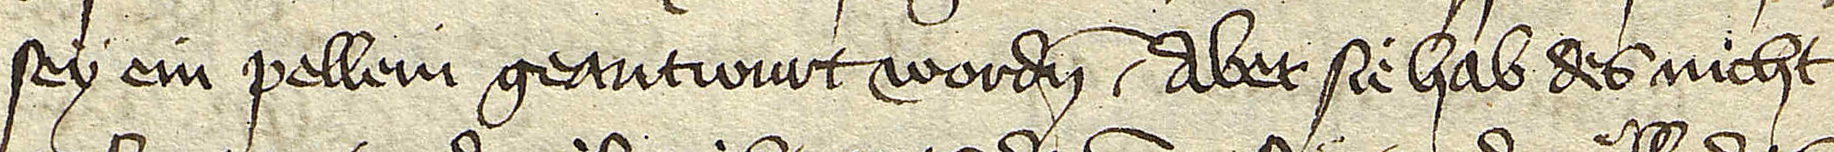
ſey ein pellein geantwurt wordn* / Aber ſie hab des nicht
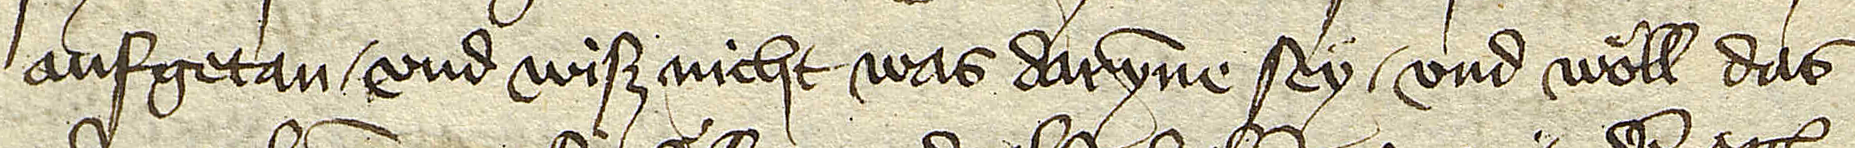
aufgetan / vnd wiſʒ nicht was daryne* ſey / vnd wöll das
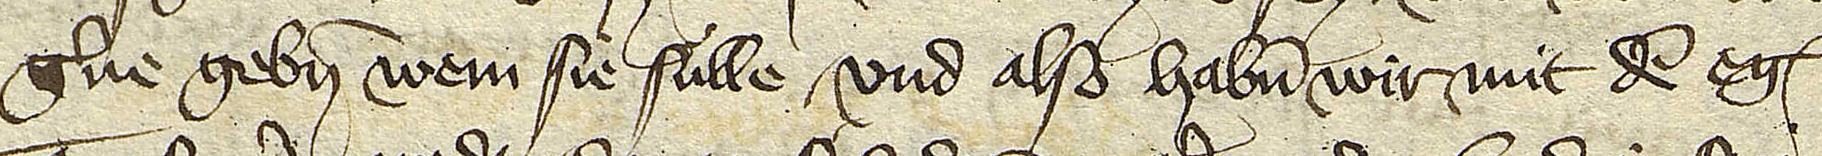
g*ne gebn* wem ſie ſülle / vnd alſo habn* wir mit d* eg*
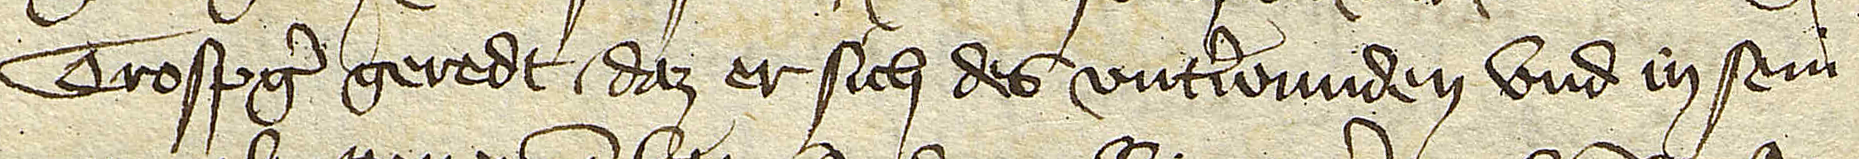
Troſtpg* geredt / daʒ er ſich des vnt*wunden vnd in ſein
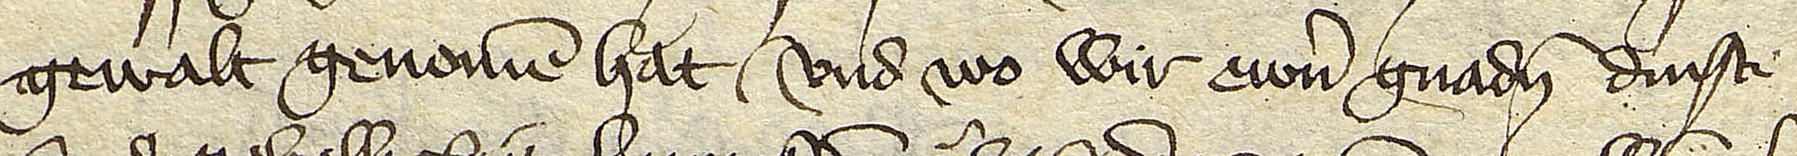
gewalt genome* hat / vnd wo wir ewn* gnadn* dinſte
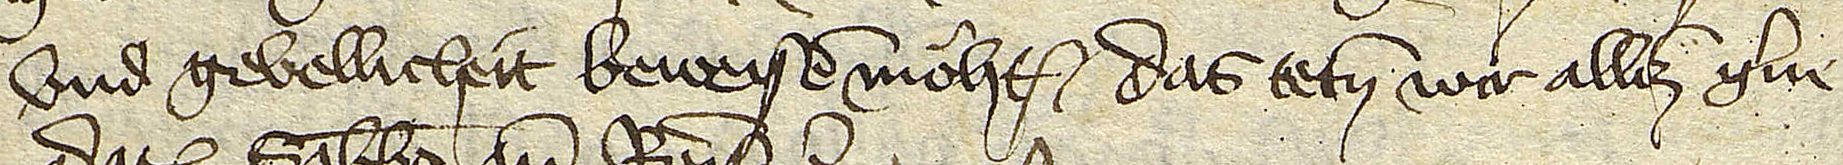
vnd gevellicheit beweiſe* möht / Das tetn* wir allcʒ* g*ne
